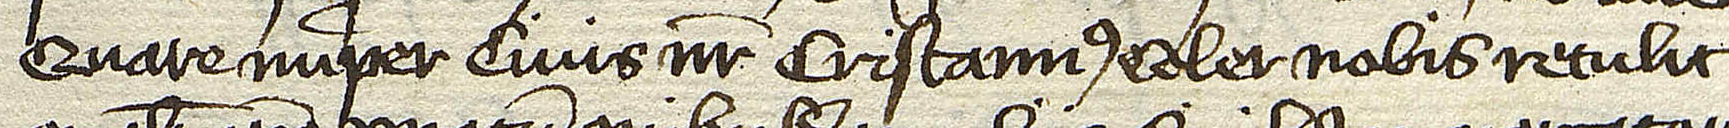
Quare nuper Ciuis n*r Cristann* Coler nobis retulit
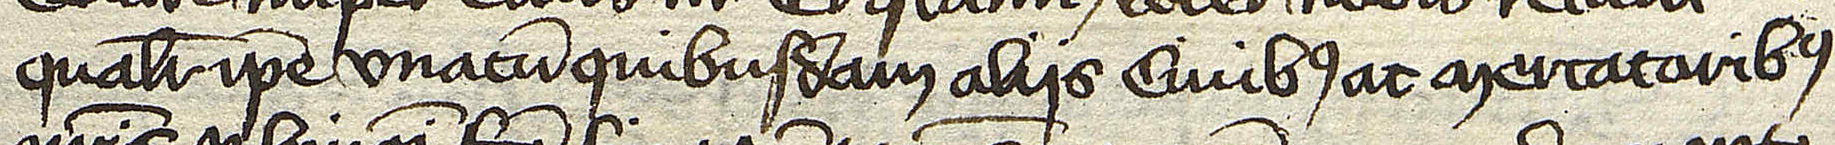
qual*r ip*e vnacu* quibusdam aliis Ciuib* ac Mercatorib*
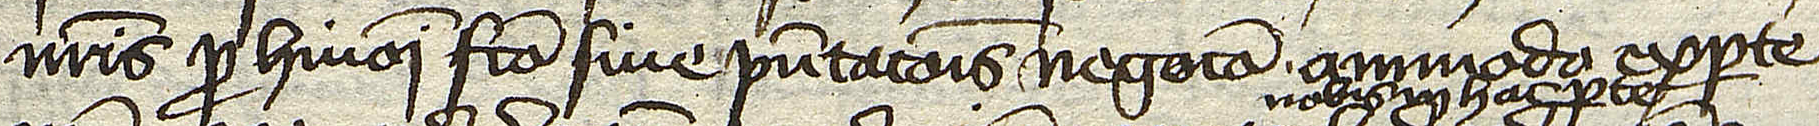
n*ris p* hui*o*i f*to ſiue p*ntat*o*is negoc*o ammodo exp*te
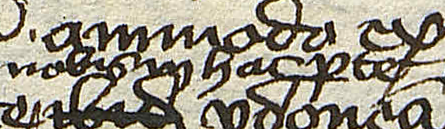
nobis in hac p*te
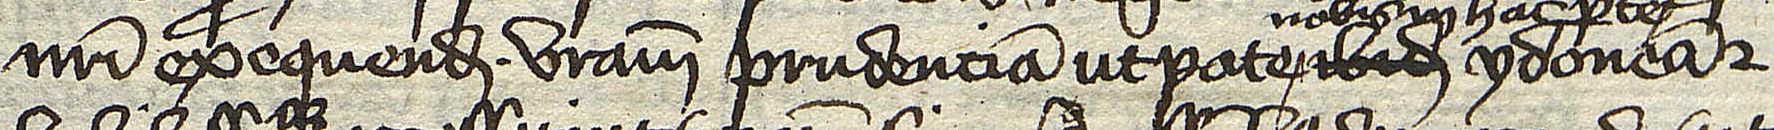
n*ri exequend* . v*ram prudentia* ut pate ibid* ydonea* @
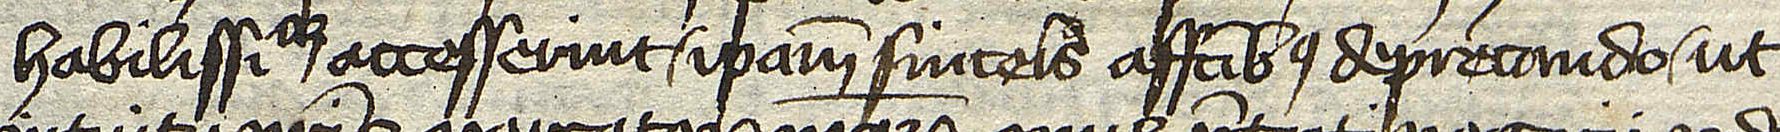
habiliſſi* acceſſerint / ip*am ſince*is aff*c*ib* d*pr*cando / ut
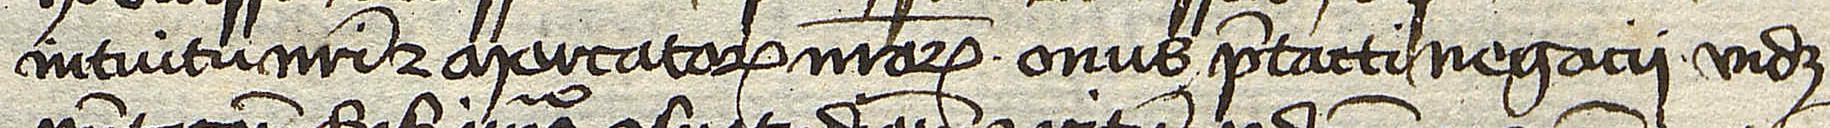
intuitu n*ri @ Mercator* n*ro* . onus p*tacti negocii vid*
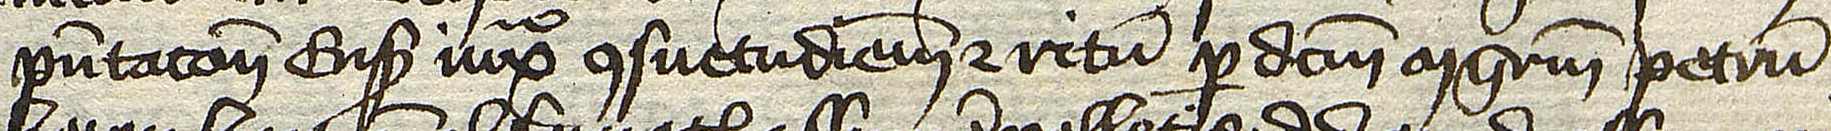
p*ntat*m Enſ* iux* *ſuetudi*em @ ritu* p* d*c*m M*g*r*m Petru*
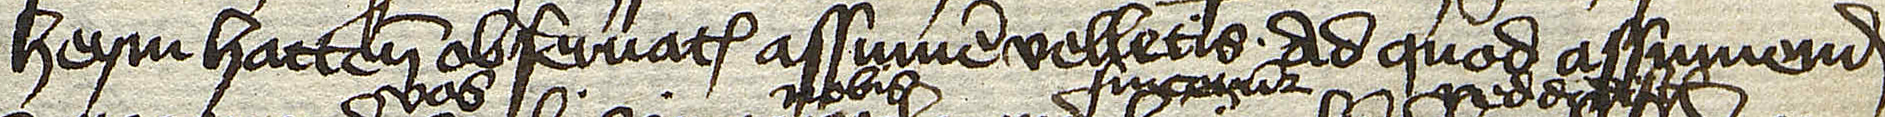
Heym hacten* obſeruat* aſſume* velletis . Ad quod aſſumend*
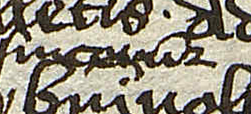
ſinceru* @
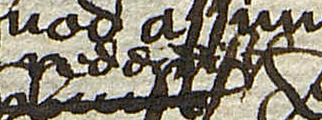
reddidiſt*
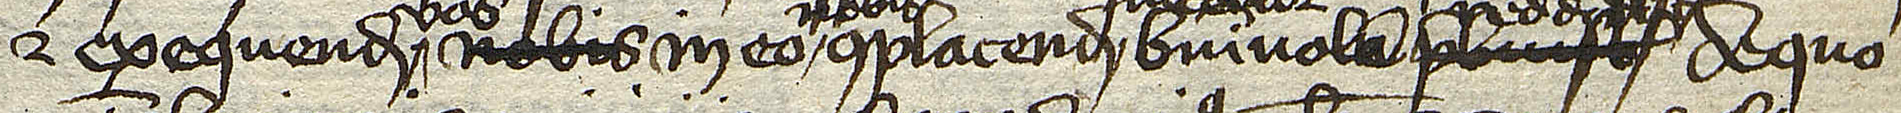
@ exequend* nobis in eo *placendi b*niuole p*buiſt* de quo
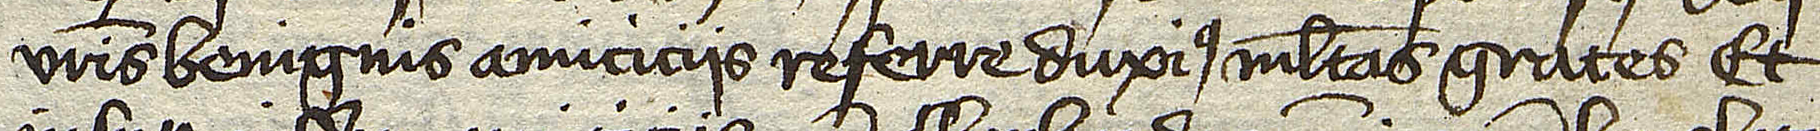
v*ris benignis amiciciis referre duxi* mltas* grates Et
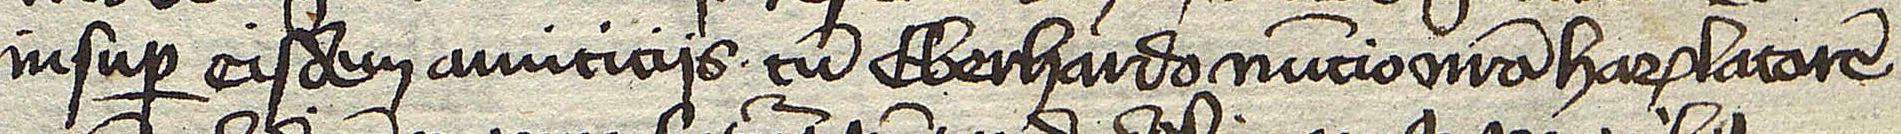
inſup* eiſdem amiciciis . cu* Eberhardo nu*cio n*ro ha* latore*
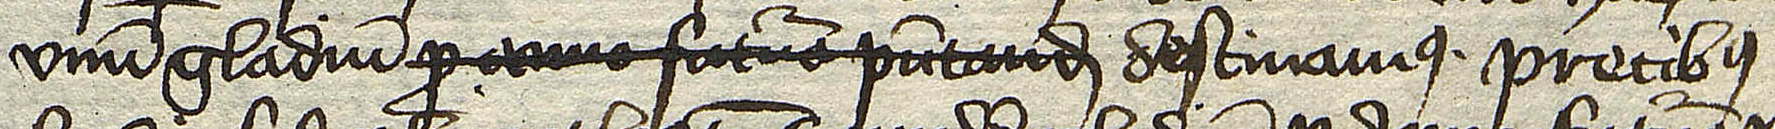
vnu* gladiu* p anno futuo* pntand* deſtinam* . precib*
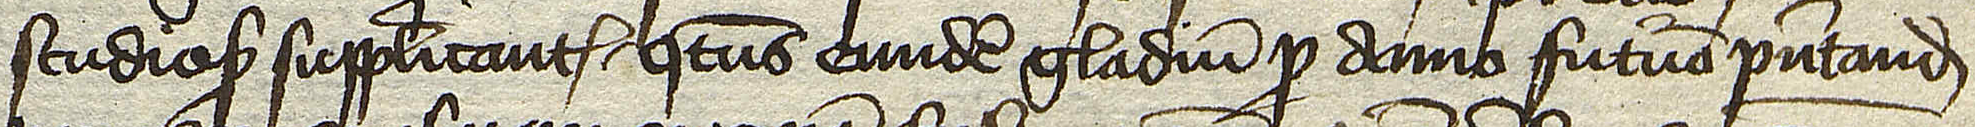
ſtudioſ* ſupplicant* / q*t*us eunde* gladiu* p* Anno futu*o p*tand*
